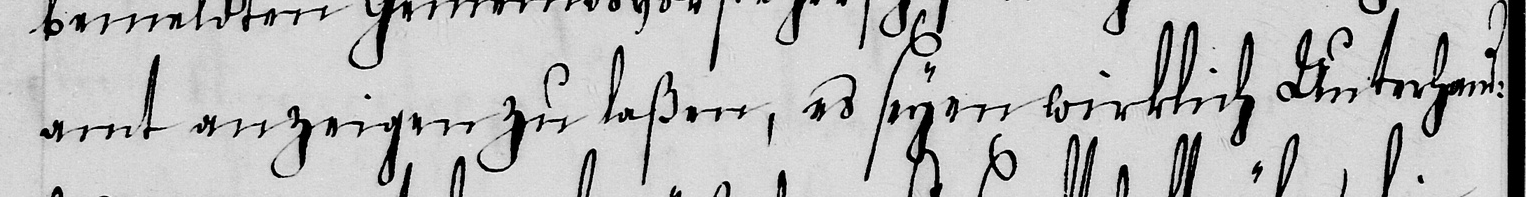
ramt anzeigen zu laßen, es seyen wirklich Unterhand¬
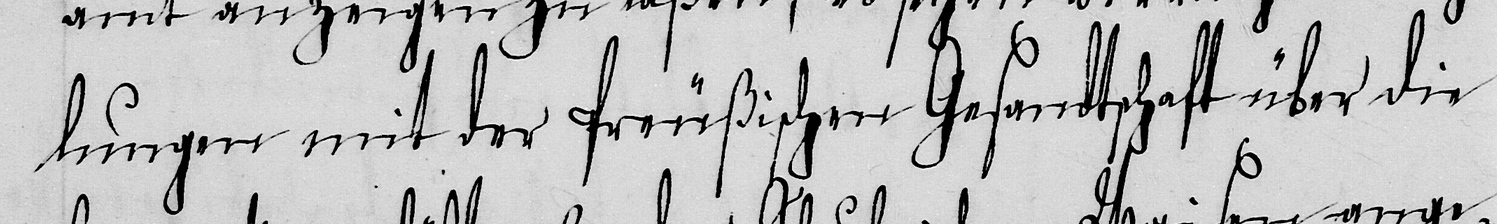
lungen mit der Preußischen Gesandtschaft über die
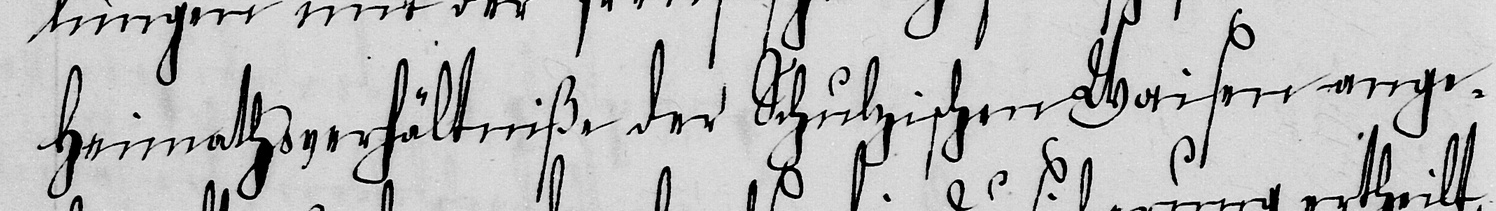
Heimathsverhältniße der Schulzischen Waisen ange¬
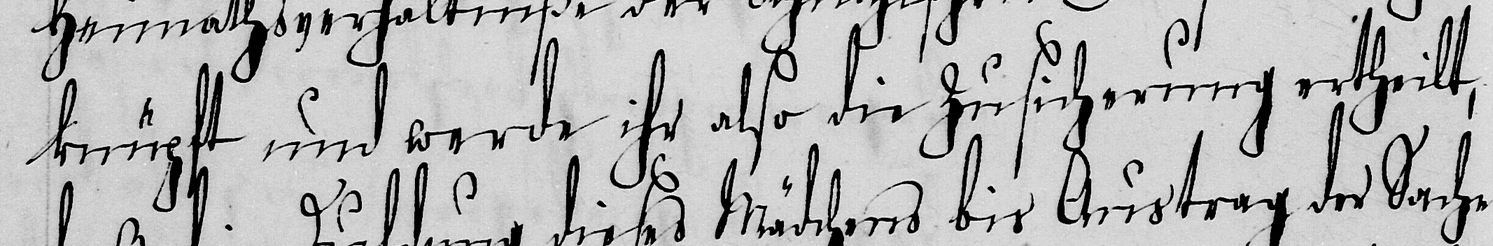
knüpft und werde ihr also die Zusicherung ertheilt,
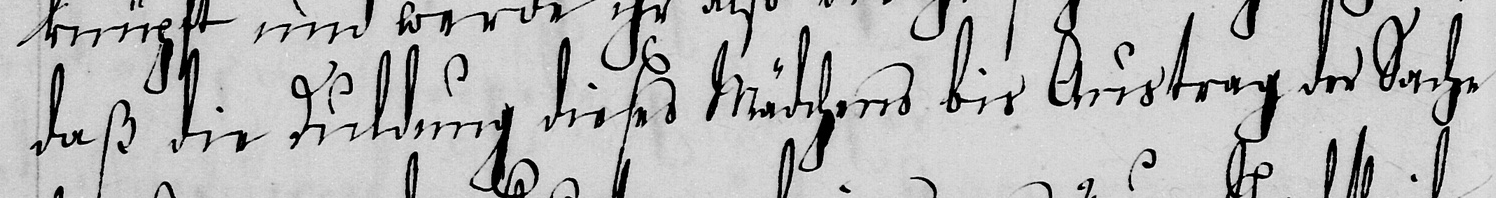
daß die Duldung dieses Mädchens bis Austrag der Sache
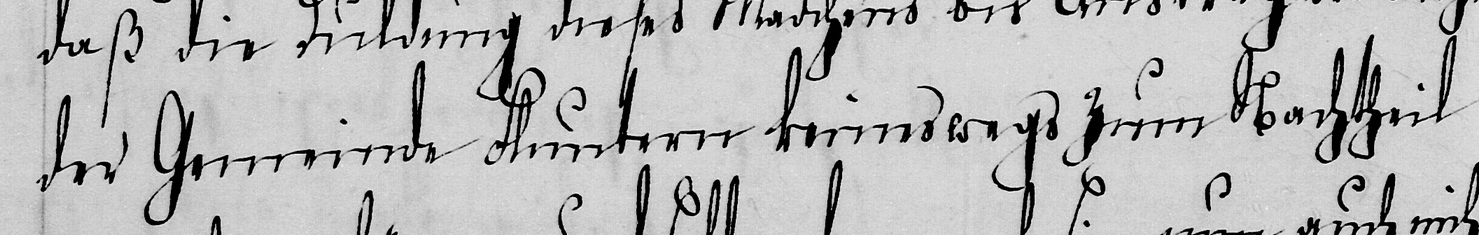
der Gemeinde Fluntern keineswegs zum Nachtheil
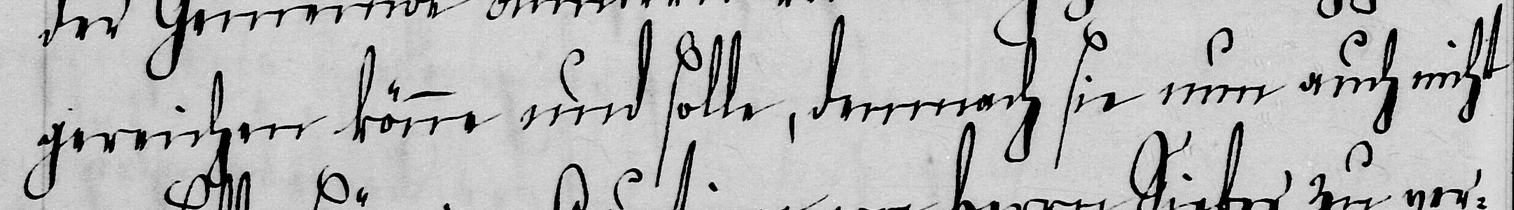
gereichen könne und solle, demnach sie nun auch nicht
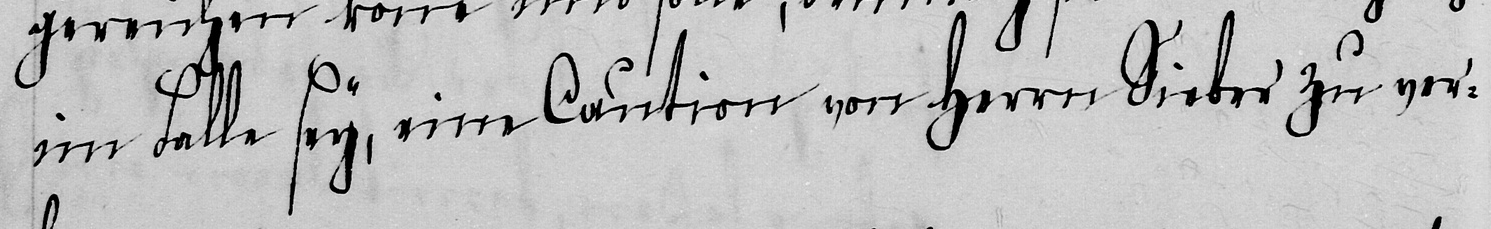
im Falle sey, eine Caution von Herrn Sieber zu ver¬
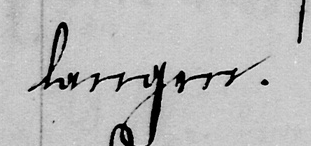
langen.
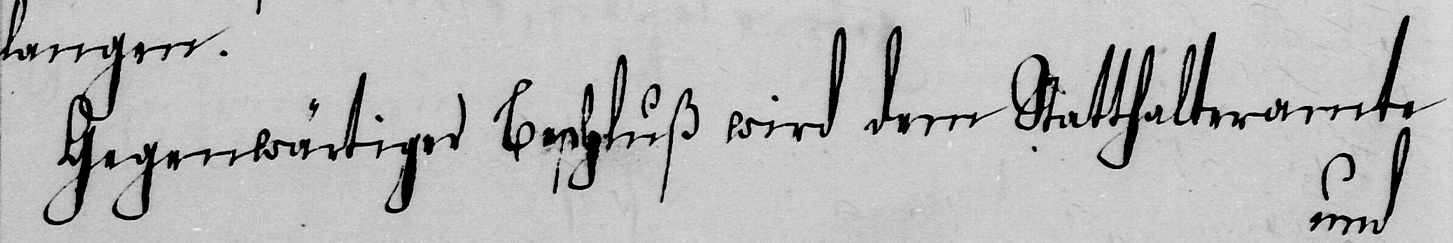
Gegenwärtiger Beschluß wird dem Statthalteramte
